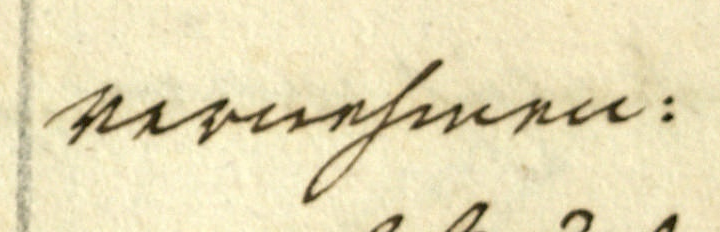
vernehmen:
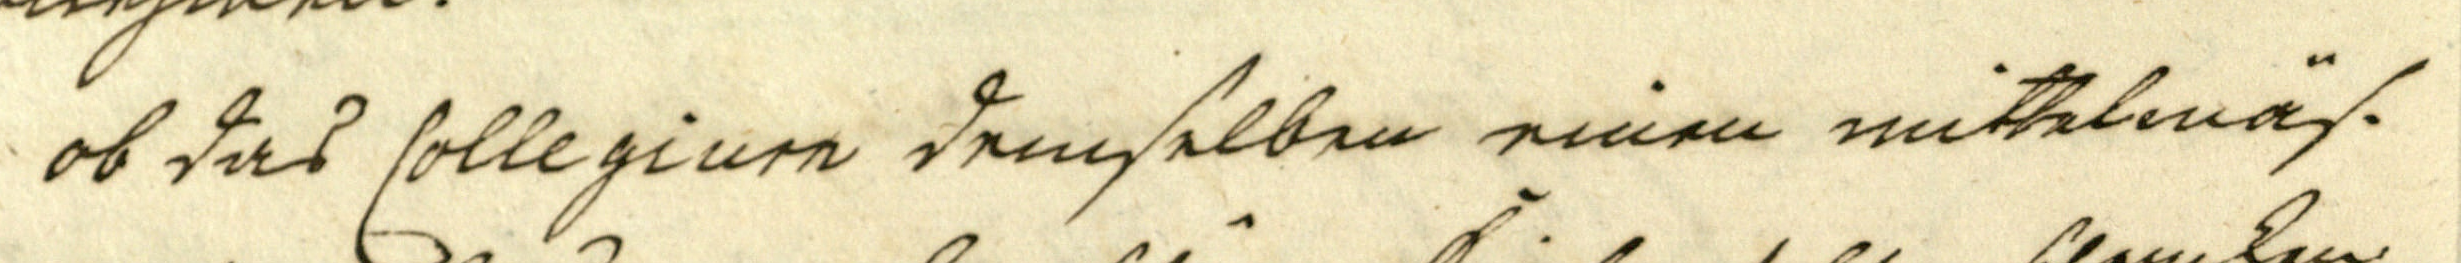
ob das Collegium demselben einen mittelmäs¬
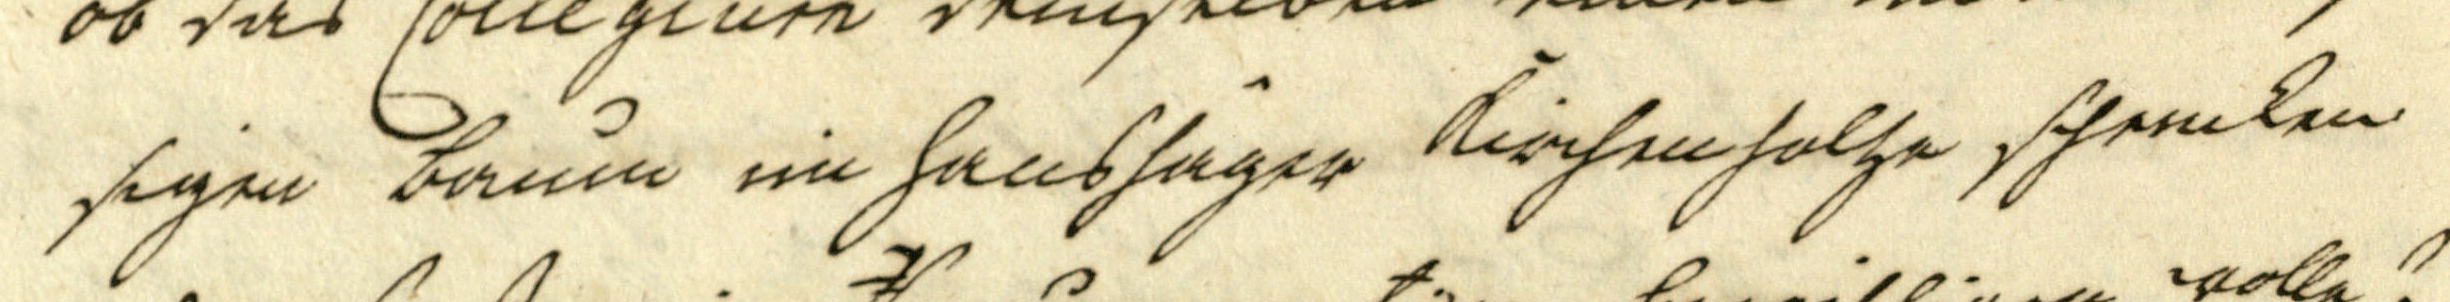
sigen Baum im Hanshägen Kirchenholze schencken
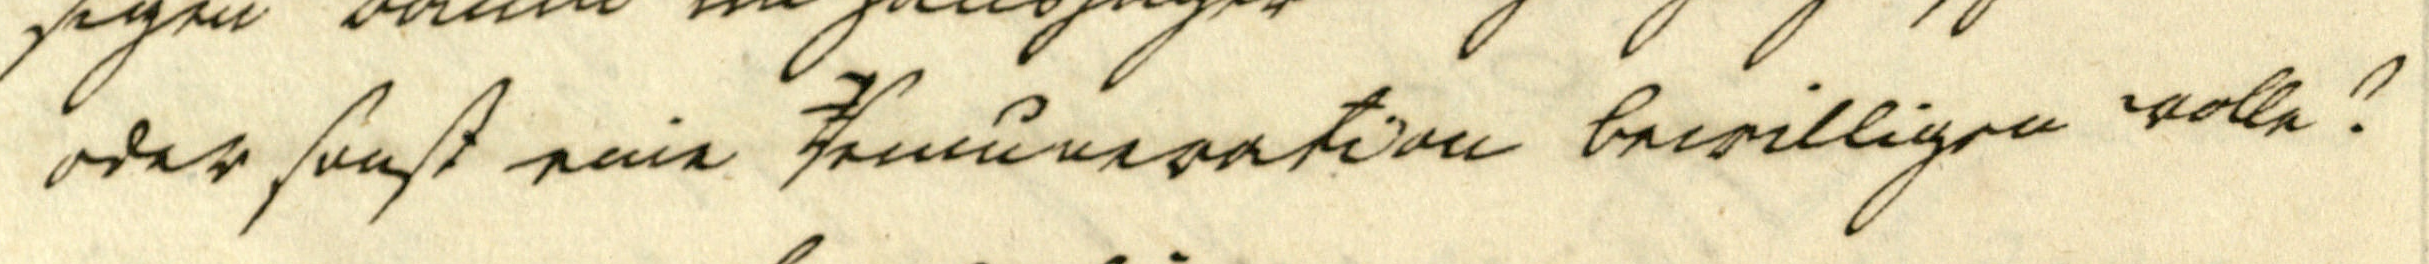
oder sonst eine Remuneration bewilligen wolle?
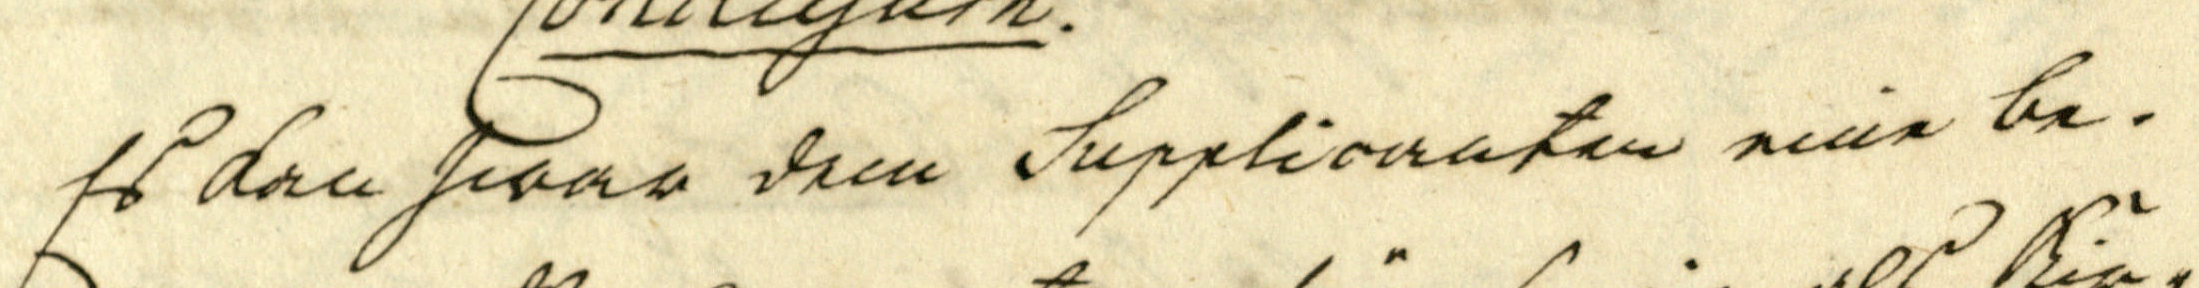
Es kan zwar dem Supplicanten eine be¬
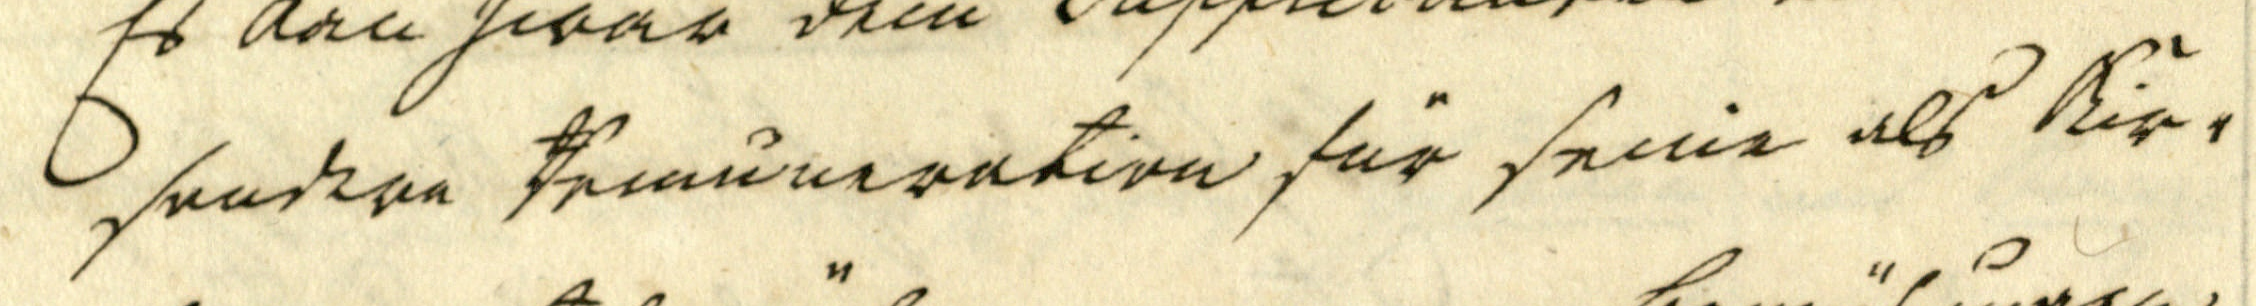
sondere Remuneration für seine als Kir¬
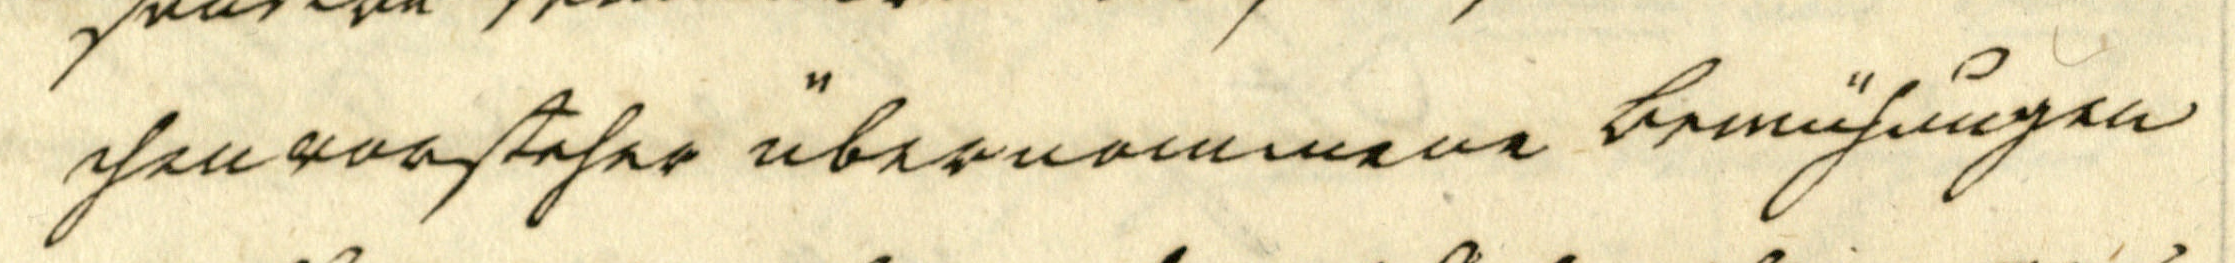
chenvorsteher übernommene Bemühungen
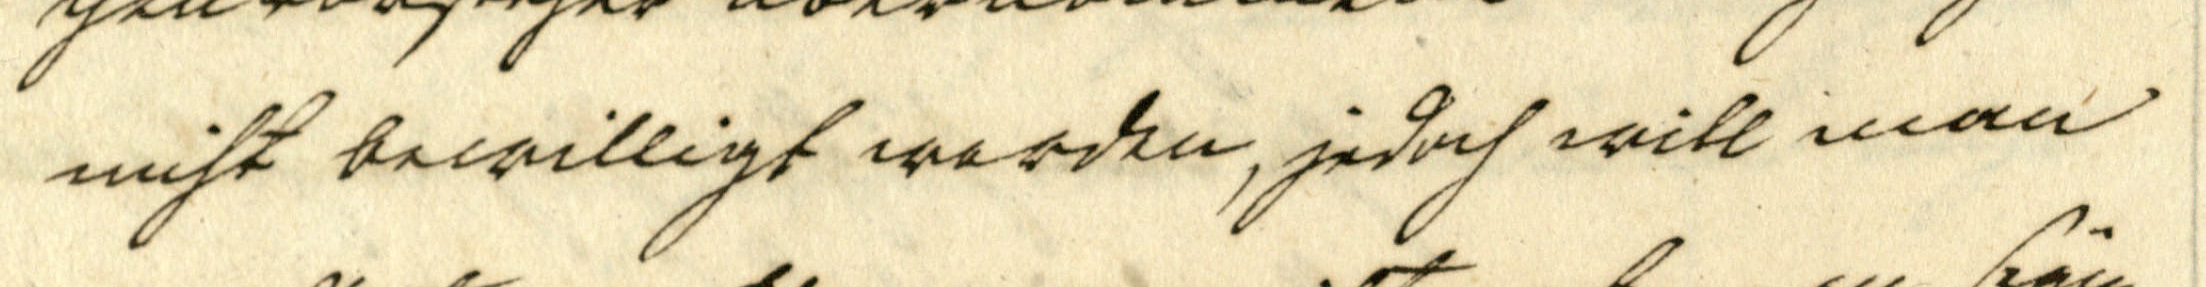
nicht bewilligt werden, jedoch will man
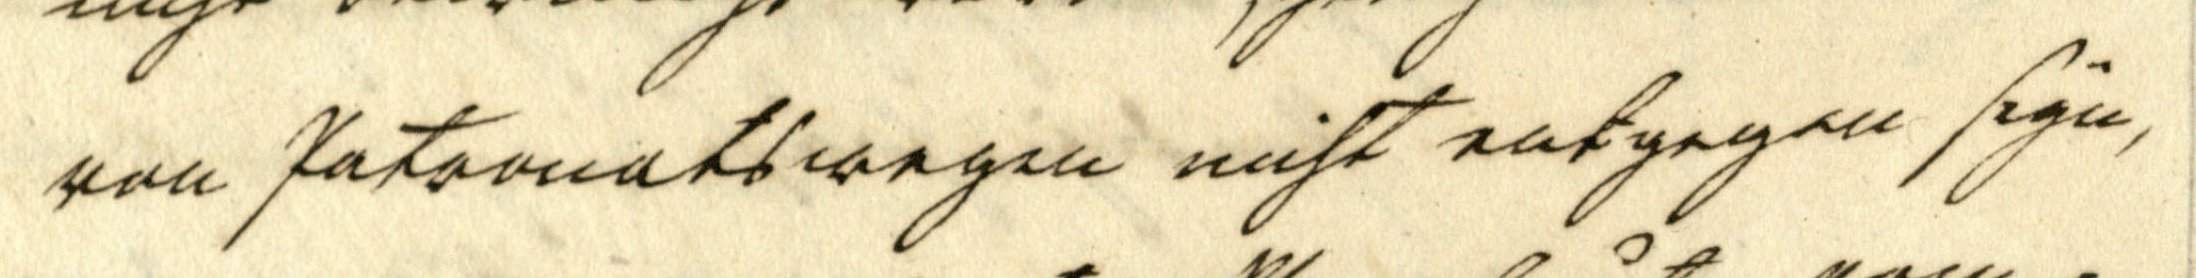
von Patromats wegen nicht entgegen seÿn,
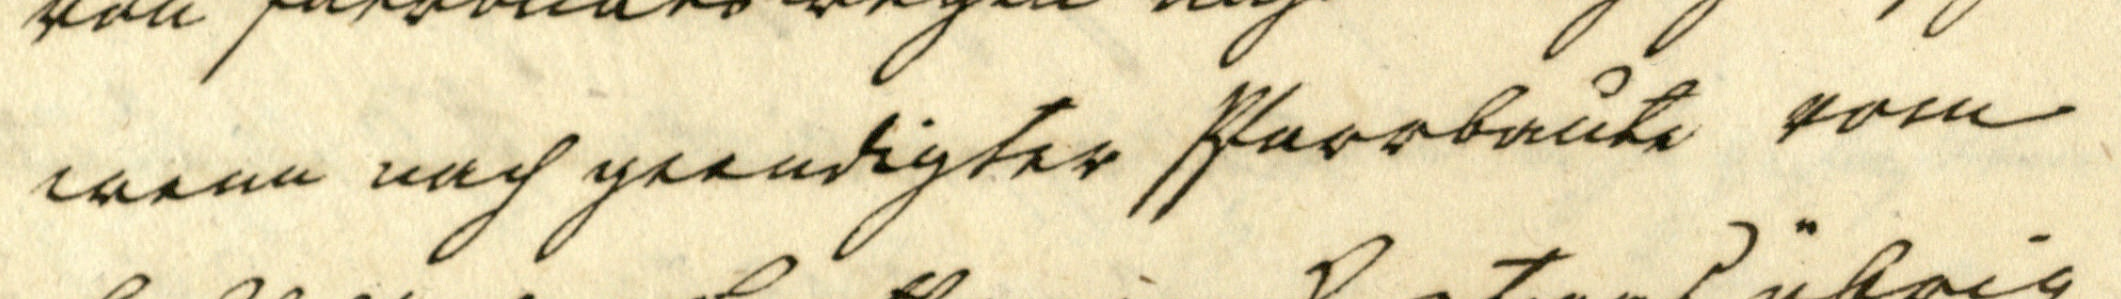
wenn nach geendigter Pfarrbaute vom
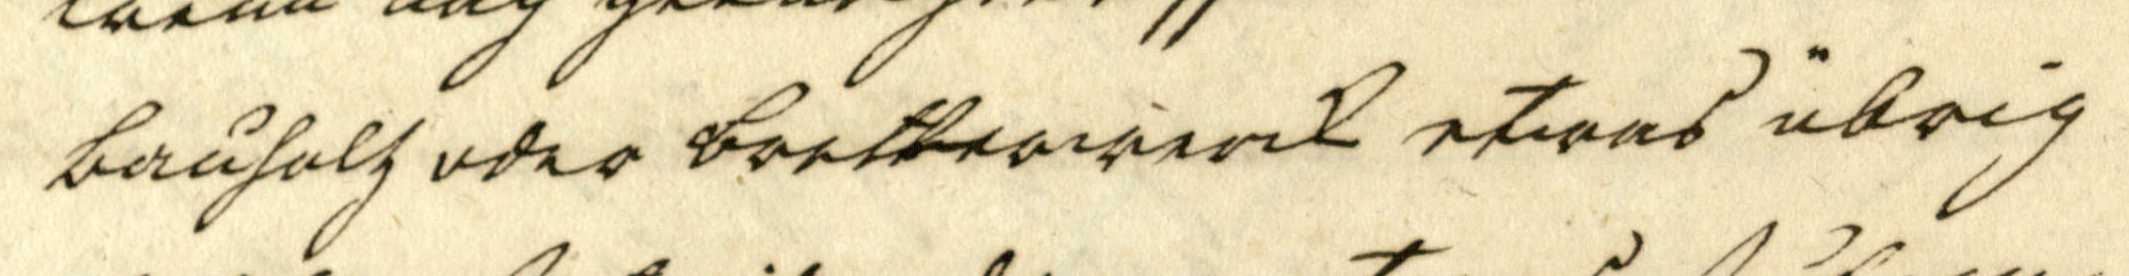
Bauholz oder Bretterwerck etwas übrig
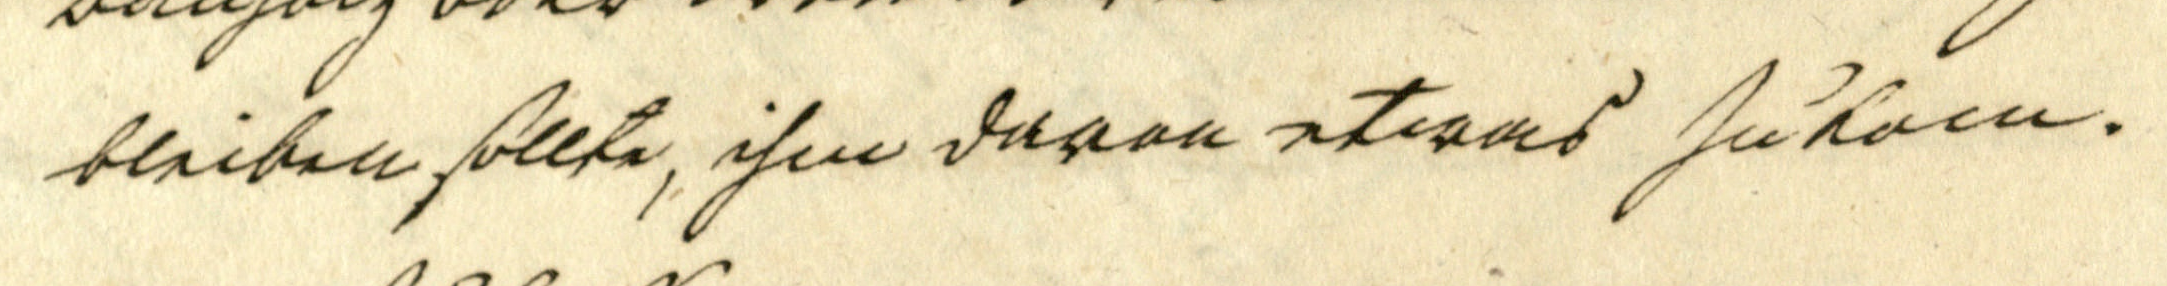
bleiben sollte, ihm davon etwas zukom¬
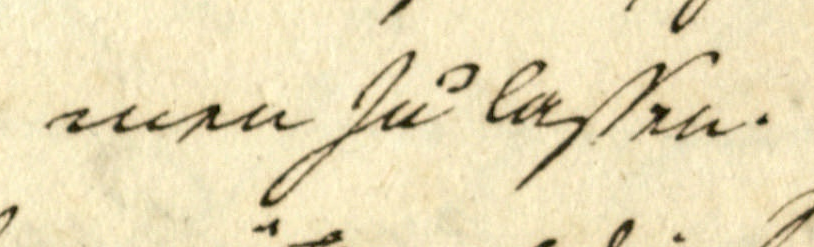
men zu lassen.
